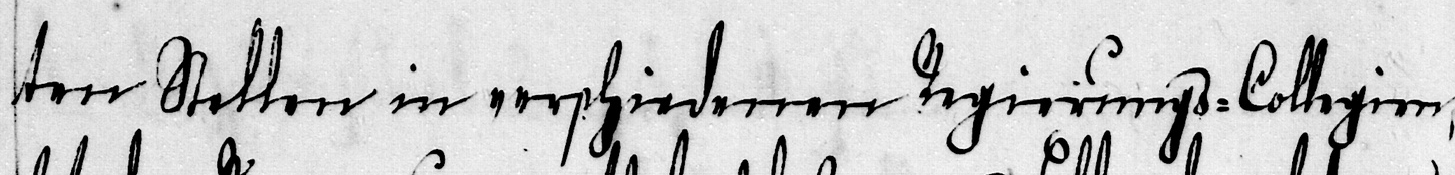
ten Stellen in verschiedenen Regierungs-Collegien,
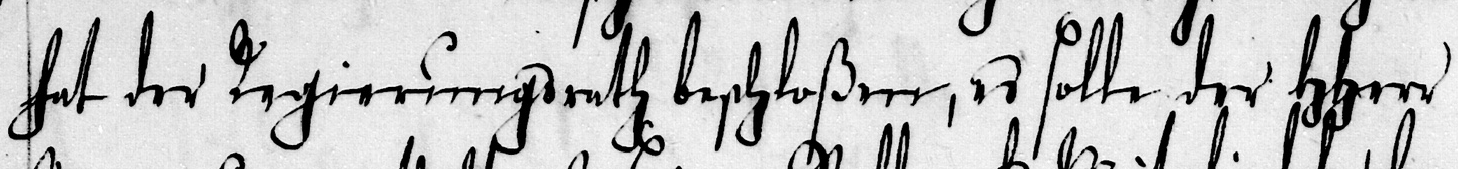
hat der Regierungsrath beschloßen, es solle der HHerr
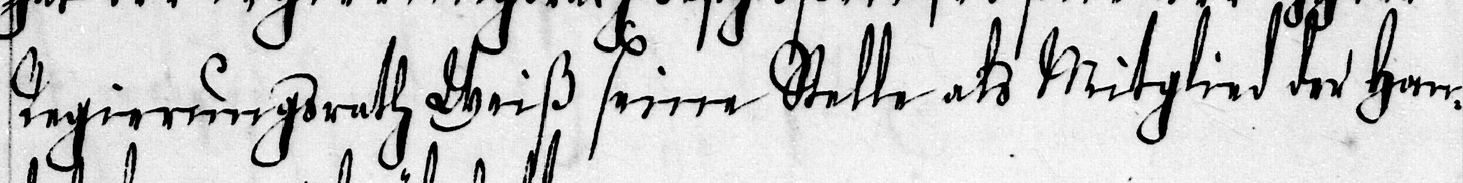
Regierungsrath Weiß seine Stelle als Mitglied der Han¬
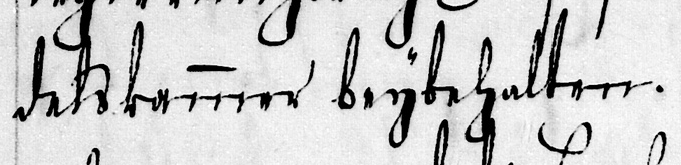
delskammer beybehalten.
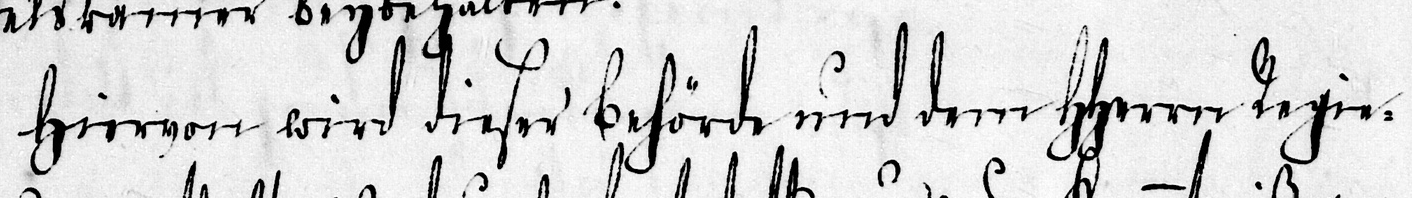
Hiervon wird dieser Behörde und dem HHerrn Regie¬
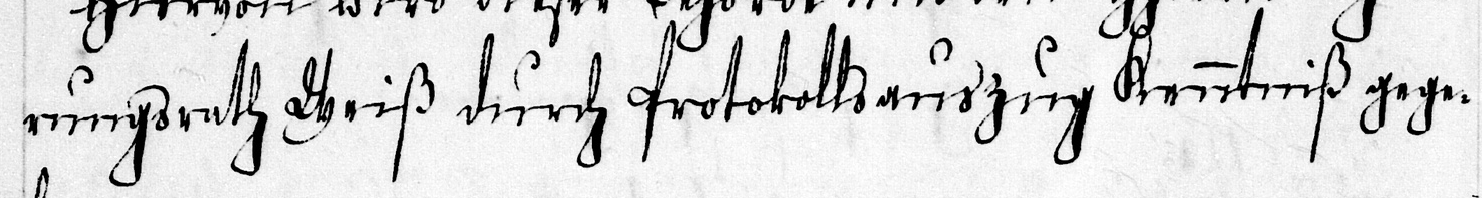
rungsrath Weiß durch Protokollsauszug Kenntniß gege¬
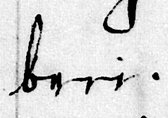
ben.
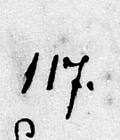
17.
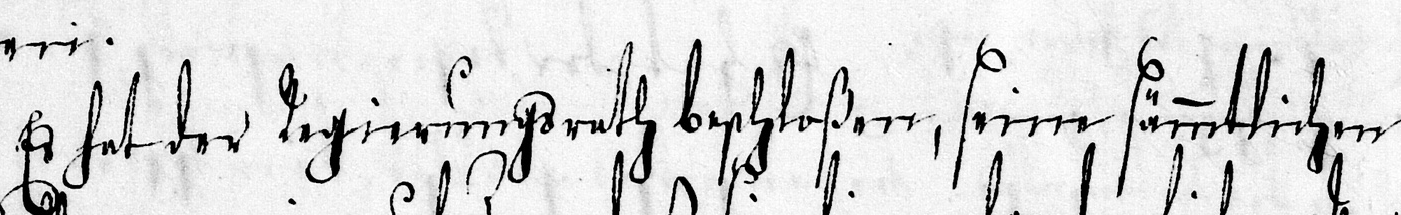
Es hat der Regierungsrath beschloßen, seine sämmtlichen
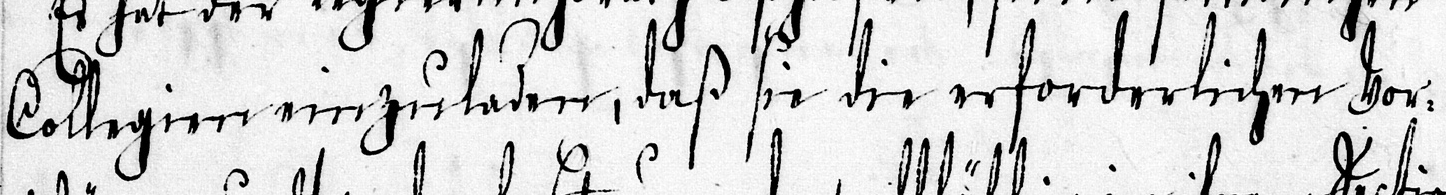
Collegien einzuladen, daß sie die erforderlichen Vors¬
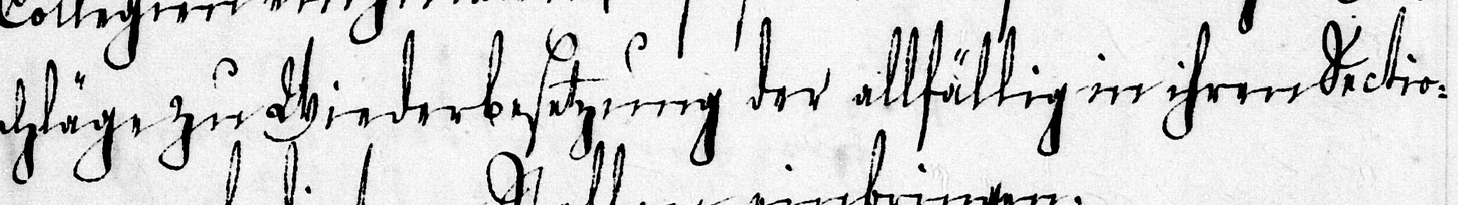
chläge zu Wiederbesetzung der allfällig in ihren Secti¬
